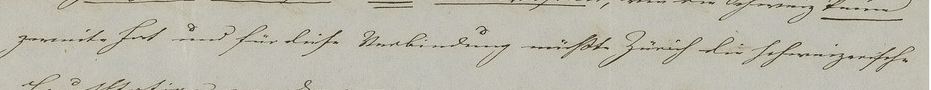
zweite hat und für diese Verbindung müßte Zürich die schweizerische
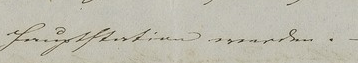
Hauptstation werden. –
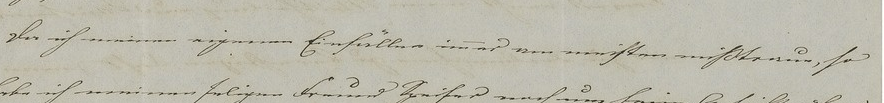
Da ich meinen eigenen Einfällen immer am meisten mißtraue, so
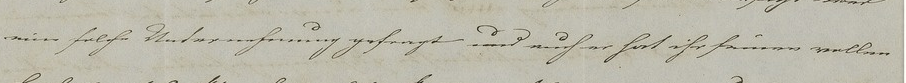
eine solche Unternehmung gefragt und auch er hat ihr seinen vollen
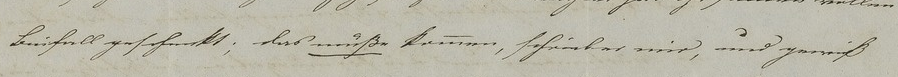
Beifall geschenkt; das müße kommen, schrieb er mir, und gewiß
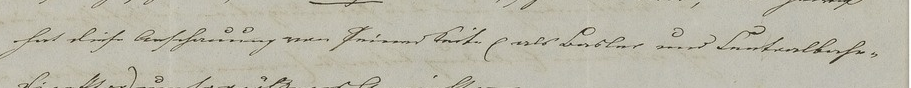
hat diese Anschauung von seiner Seite (als Basler und Centralbahn-
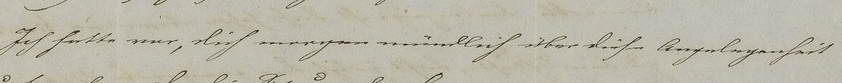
Ich hatte vor, Dich morgen mündlich über diese Angelegenheit
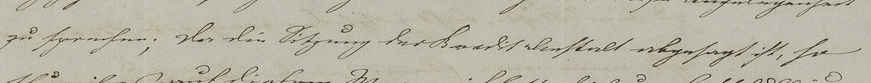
zu sprechen; Da die Sitzung der Kredit-Anstalt abgesagt ist, so
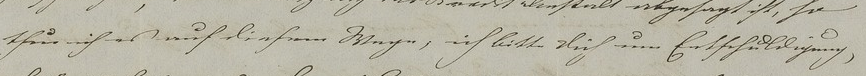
thue ich es auf diesem Wege; ich bitte Dich um Entschuldigung,
